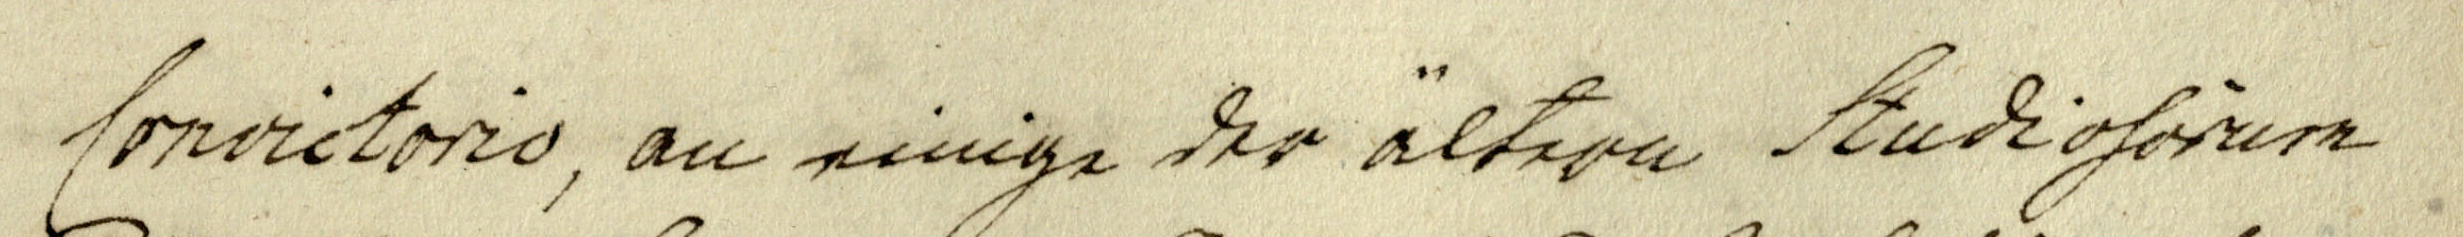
Convictorio, an einige der ältern Studiosorum
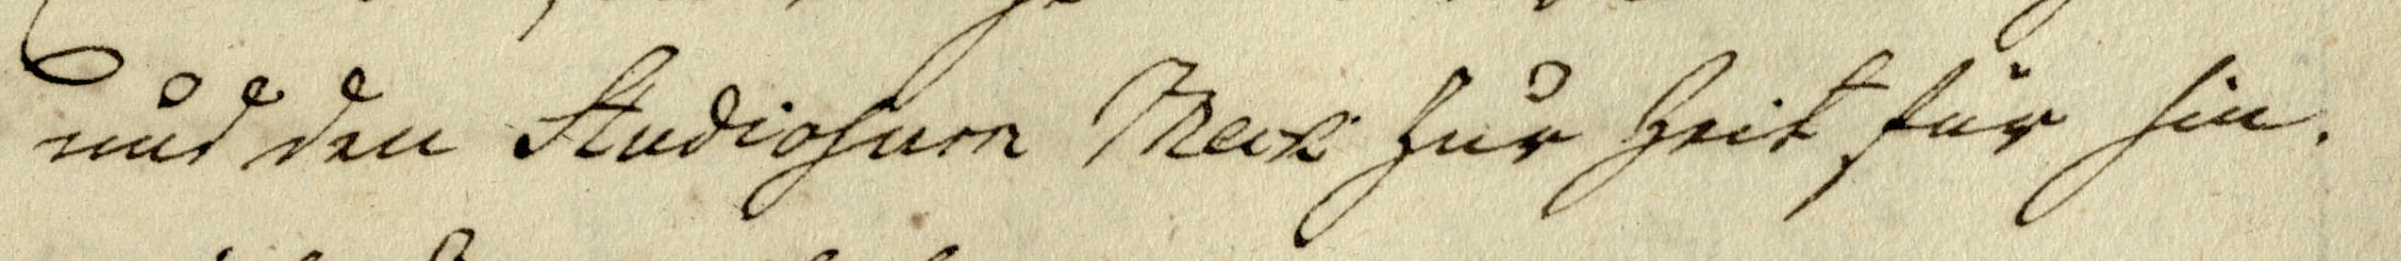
und den Studiosum Meck zur Zeit für hin¬
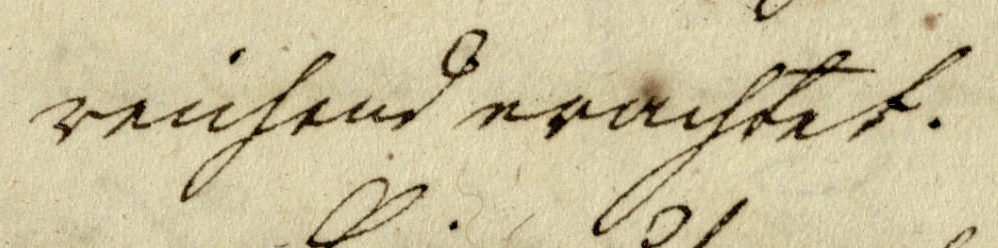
reichen erachtet.
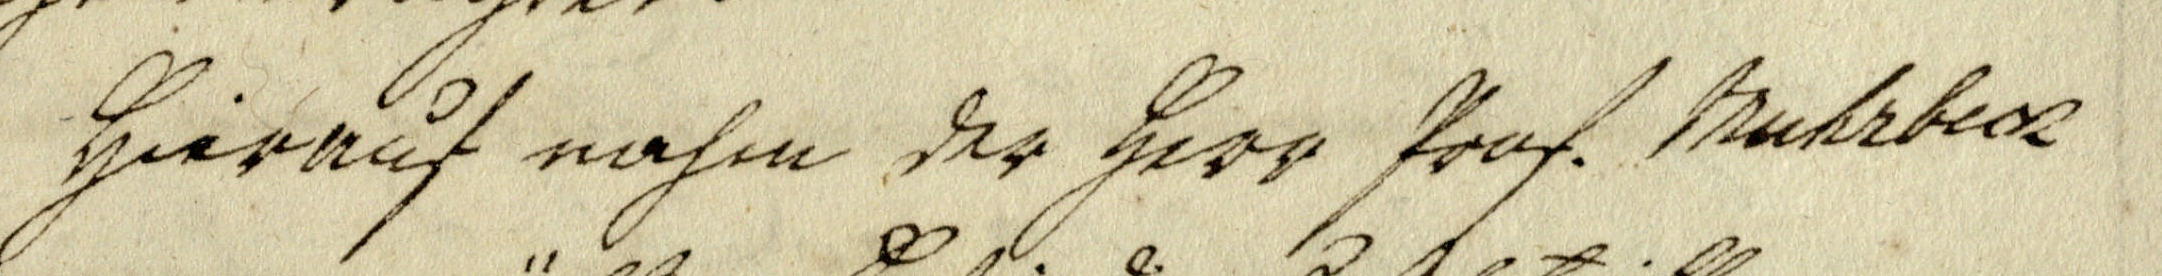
Hierauf nahm der Herr Prof. Muhrbeck
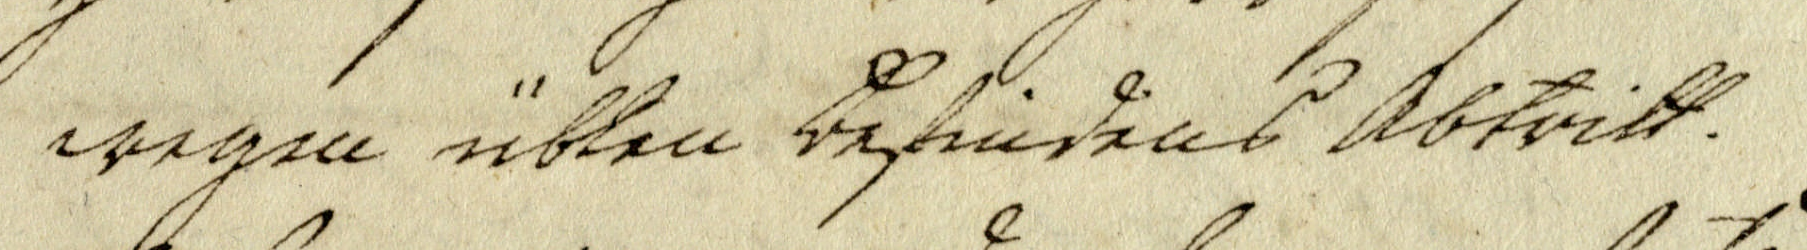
wegen üblen Befindens Abtritt.
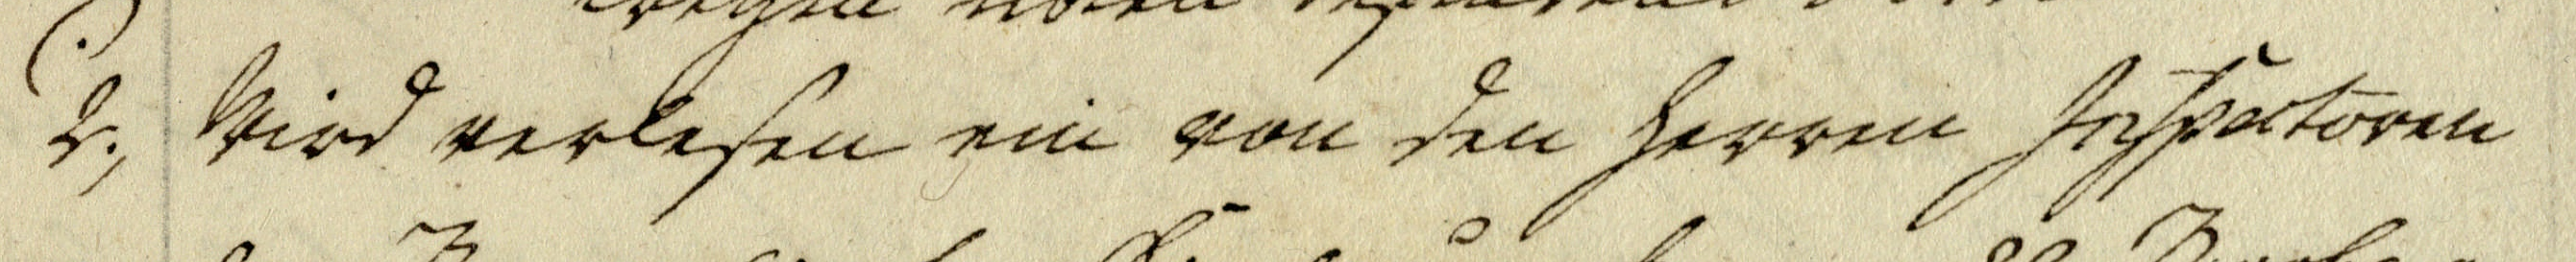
2. Wird verlesen ein von den Herren Inspectoren
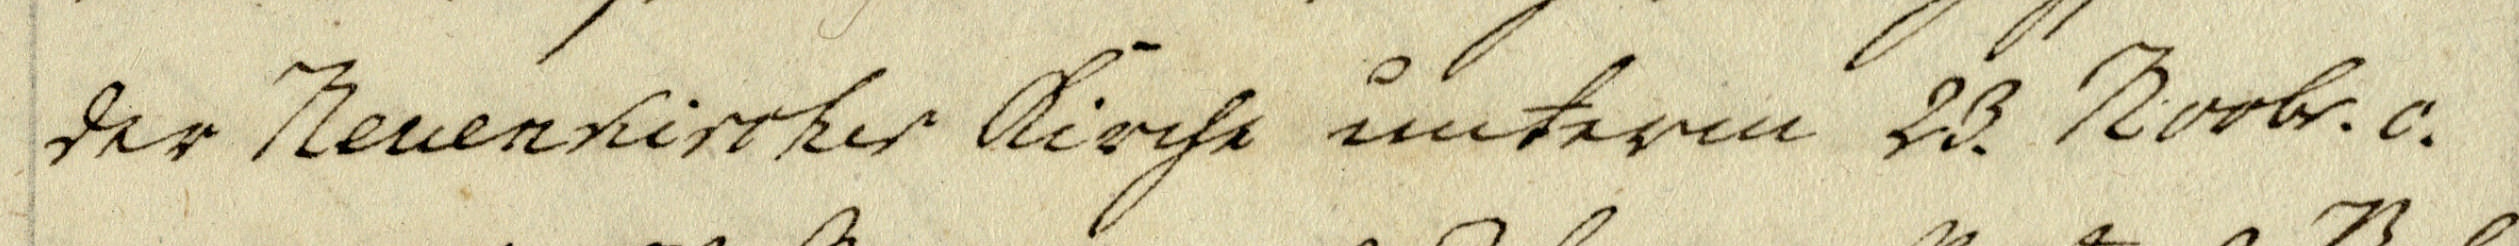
der Neuenkircher Kirche unterm 23. Novbr. c.
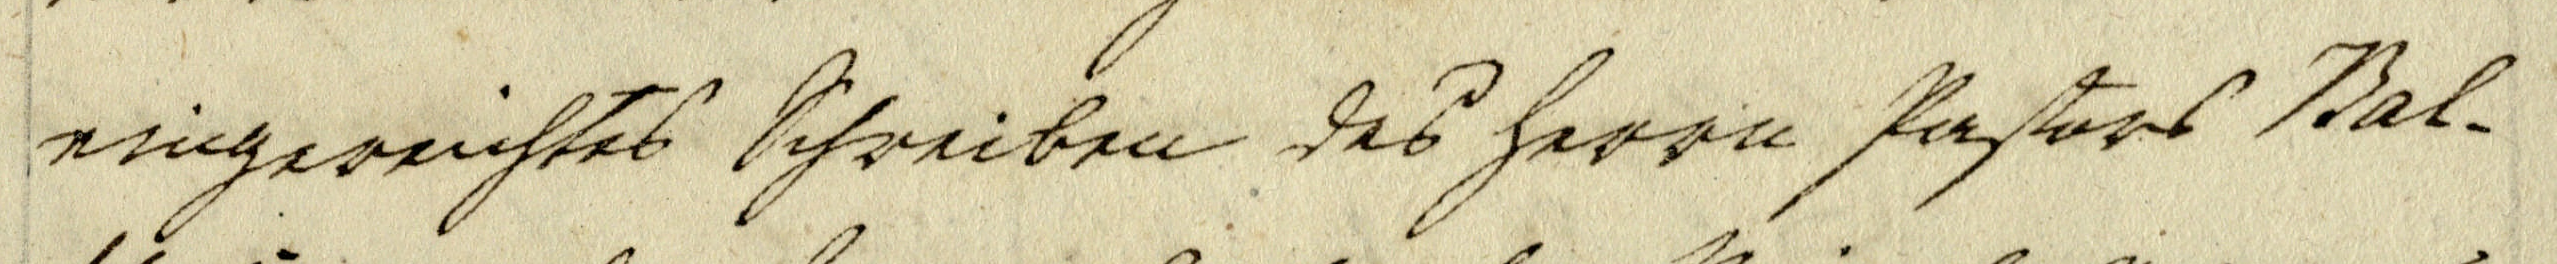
eingereichtes Schreiben des Herrn Pastors Bal¬
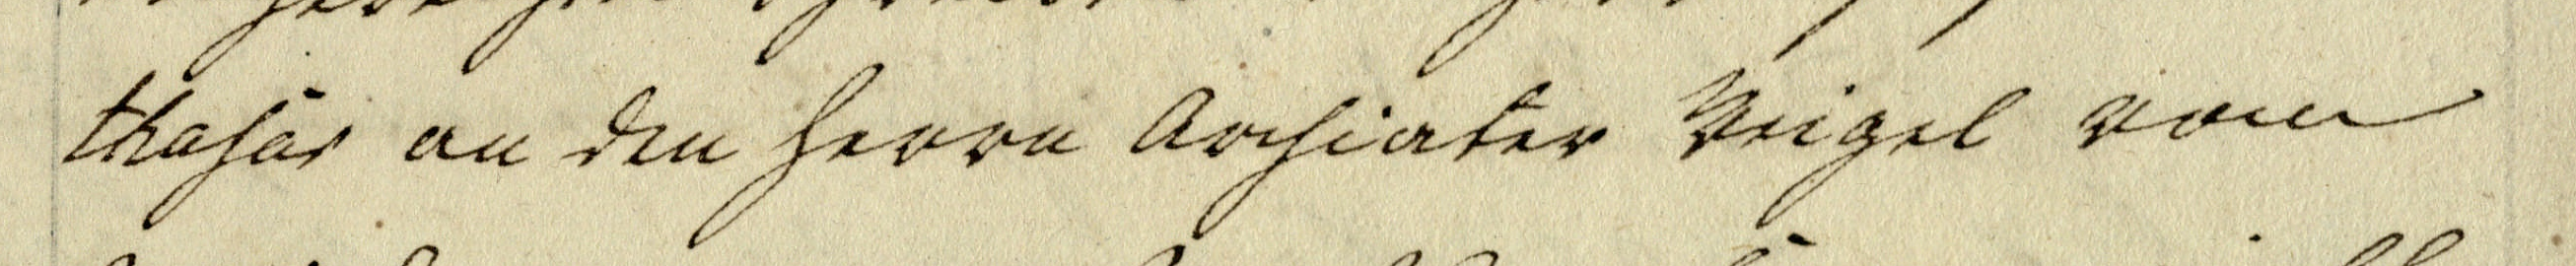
thasar an den Herrn Archiater Weigel vom
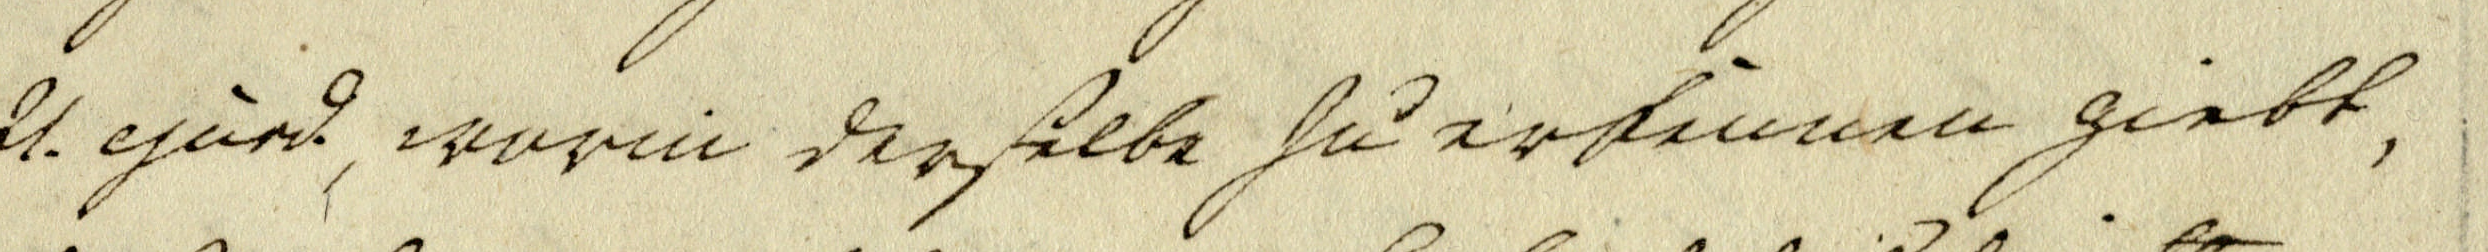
21. ejusd. worin derselbe zu erkennen giebt,
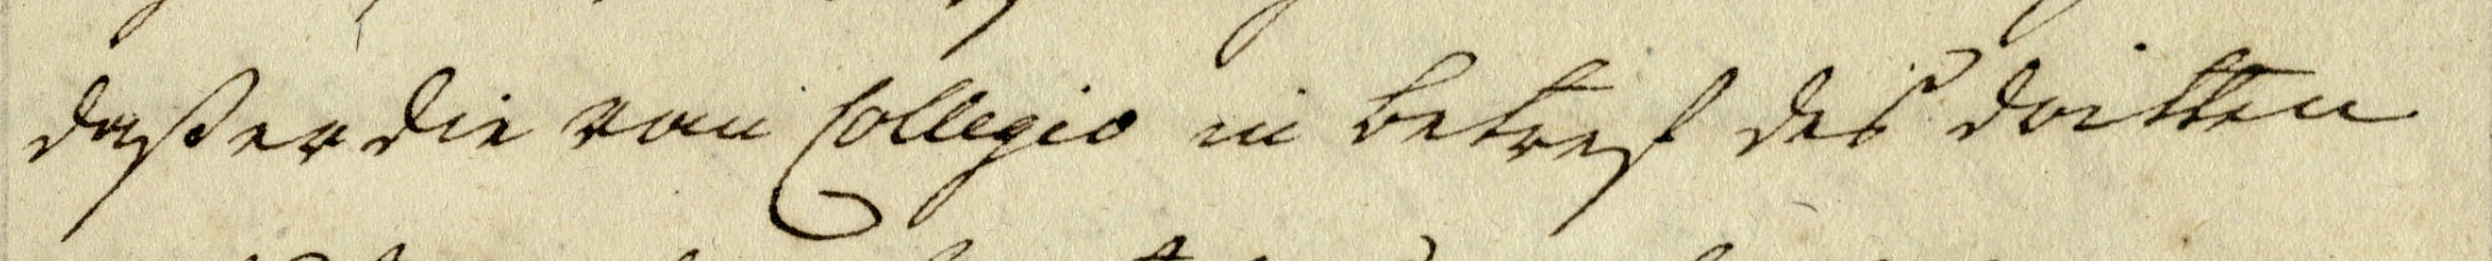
daß er die vom Collegio in Betref des dritten
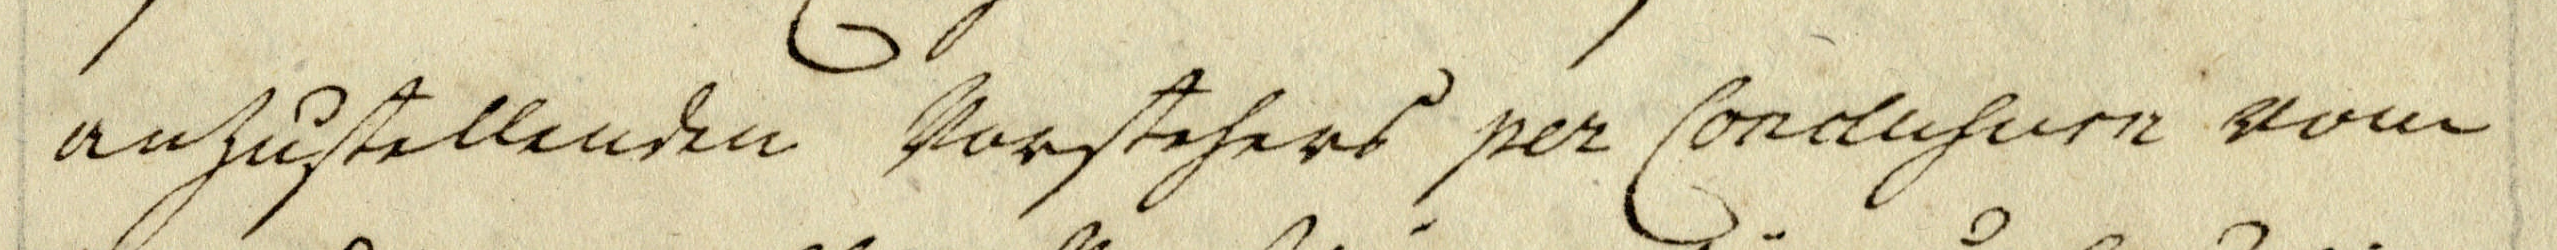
anzustellenden Vorstehers per Conclusum vom
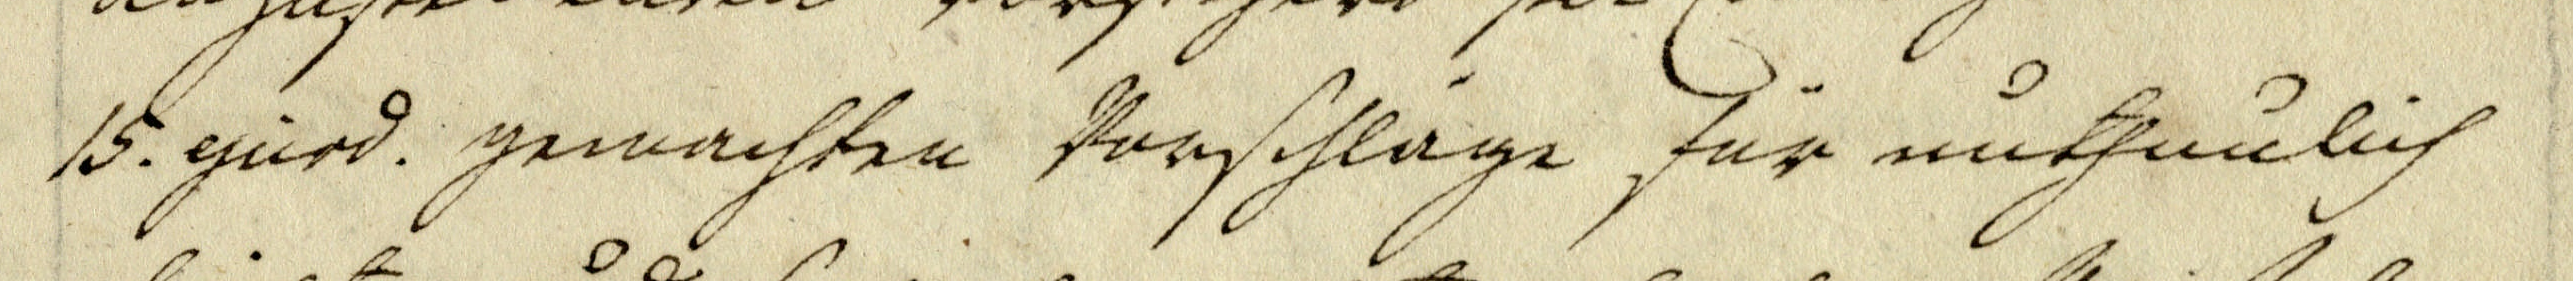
15. ejusd. gemachten Vorschläge für unthunlich
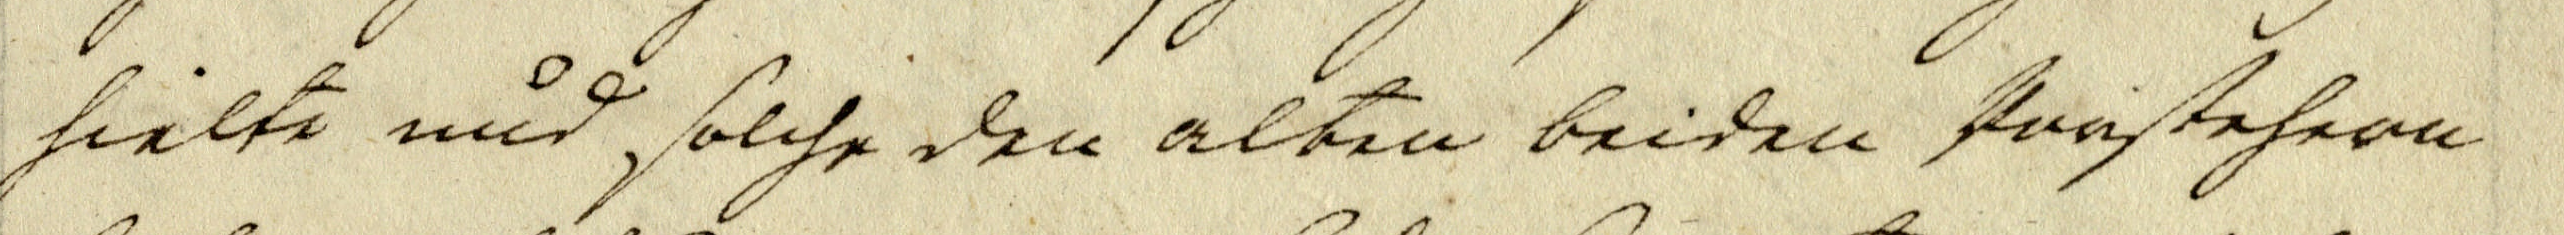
hielte und solche den alten beiden Vorstehern
